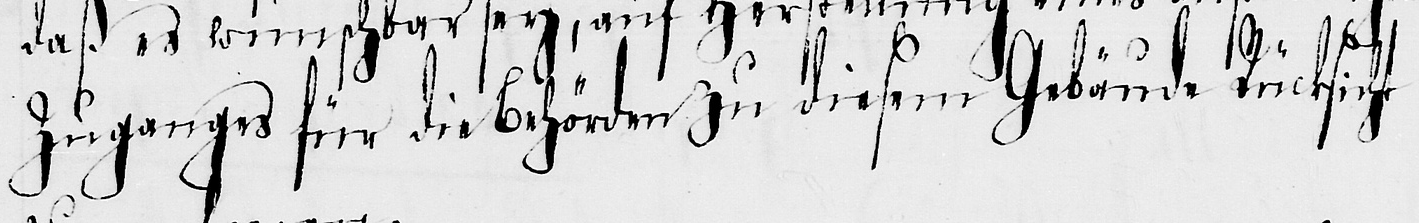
Zuganges für die Behörden zu diesem Gebäude Rücksic¬
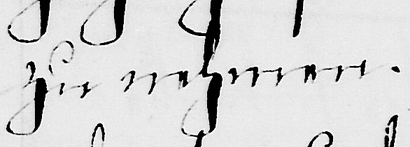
zu nehmen.
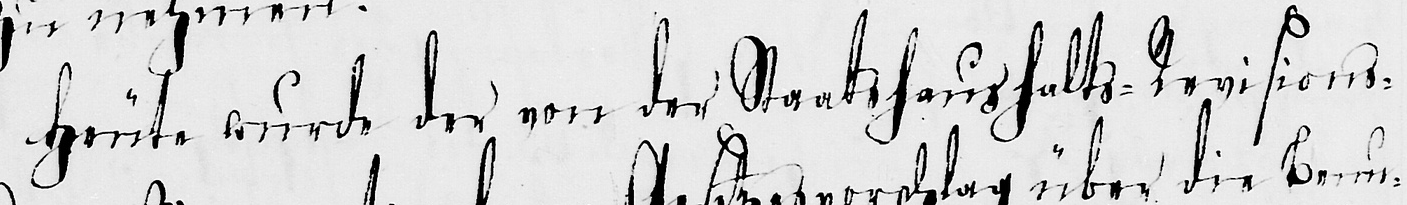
Heute wurde der von der Staatshaushalts-Revision¬
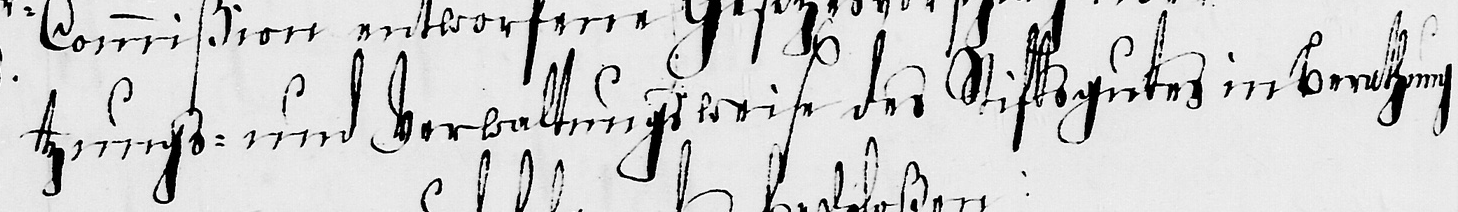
tzungs- und Verwaltungsweise des Stiftsgutes in Berathu¬
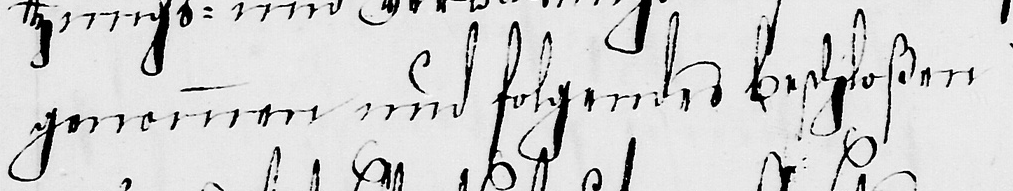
genommen und folgendes beschloßen:
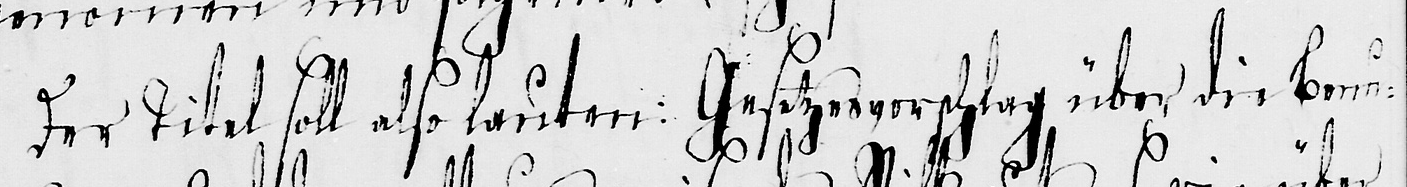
Der Titel soll also lauten: Gesetzesvorschlag über die Benu¬
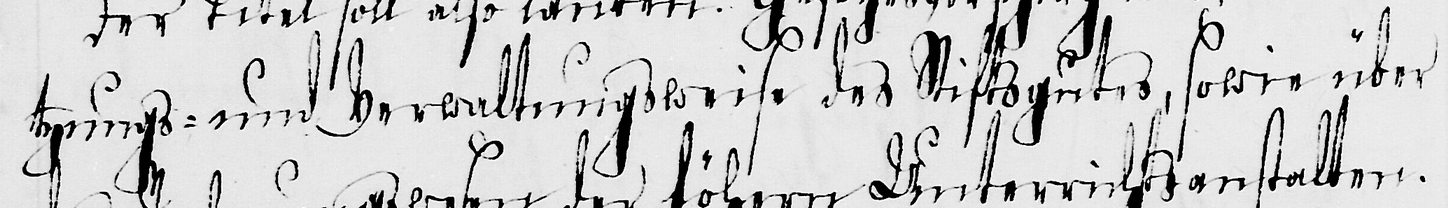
tzungs- und Verwaltungsweise des Stiftsgutes, sowie über
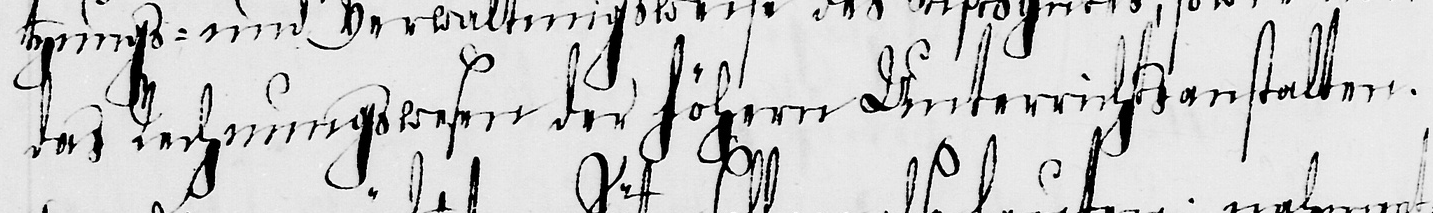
das Rechnungswesen der Höhern Unterrichtsanstalten.
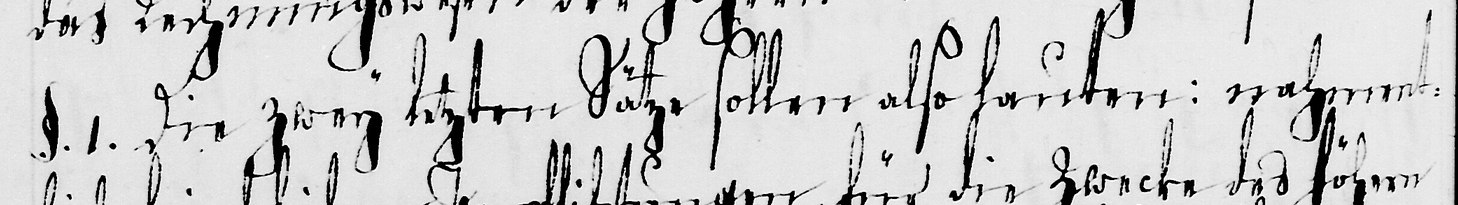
§. 1. Die zwey letzten Sätze sollen also lauten: nahment¬
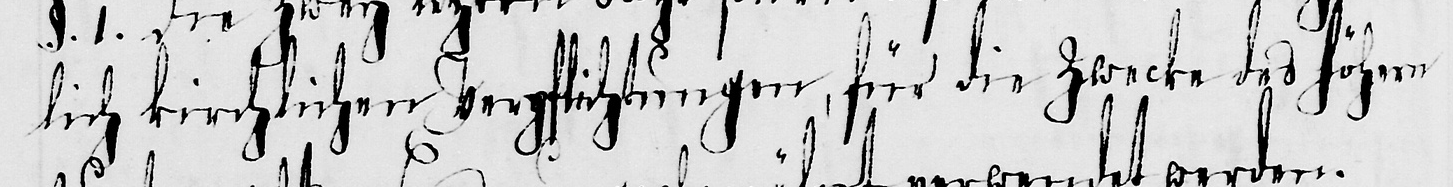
lich kirchlichen Verpflichtungen, für die Zwecke des Höhern
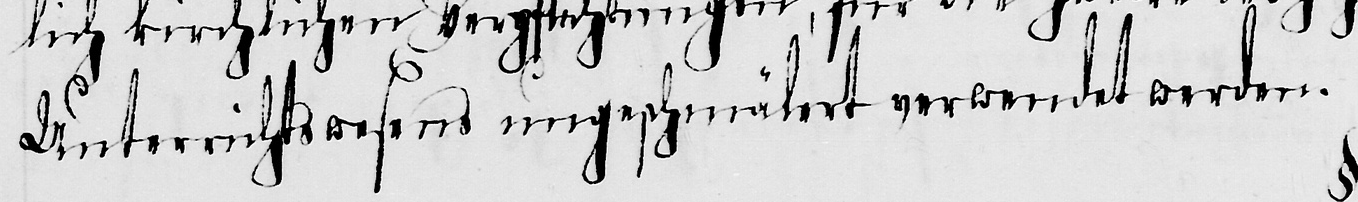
Unterrichtswesens ungeschmälert verwendet werden.
